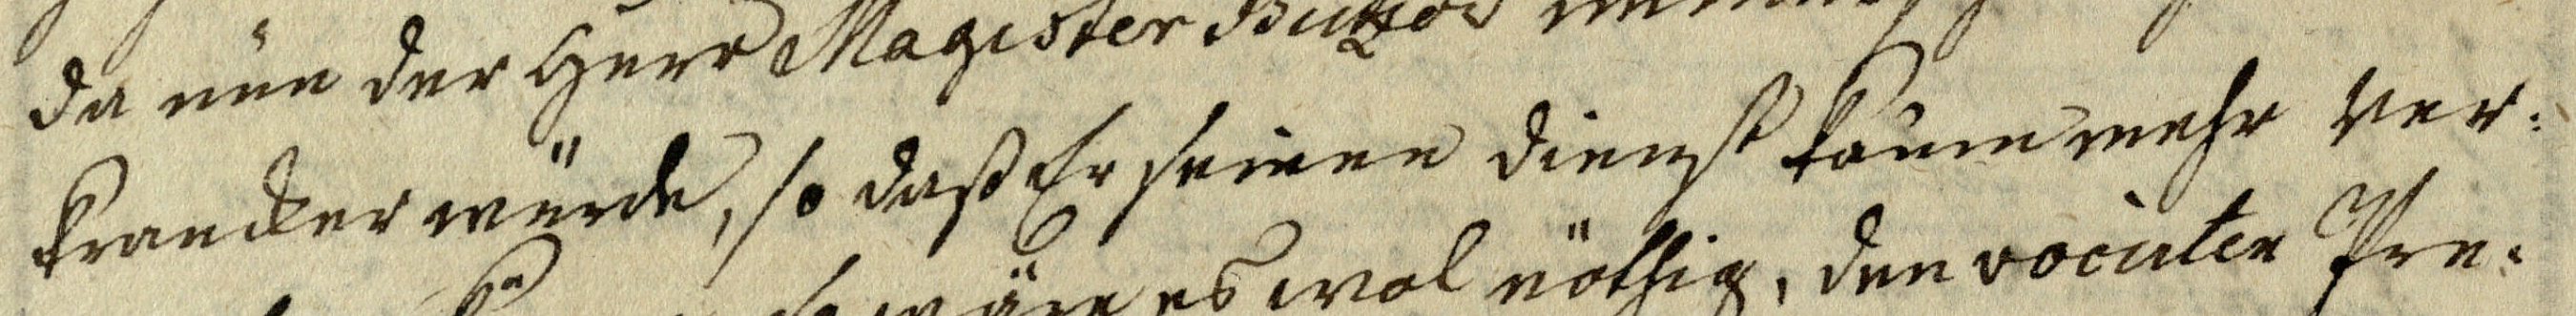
krancker würde, so daß Er seinen Dienst kaum mehr ver¬
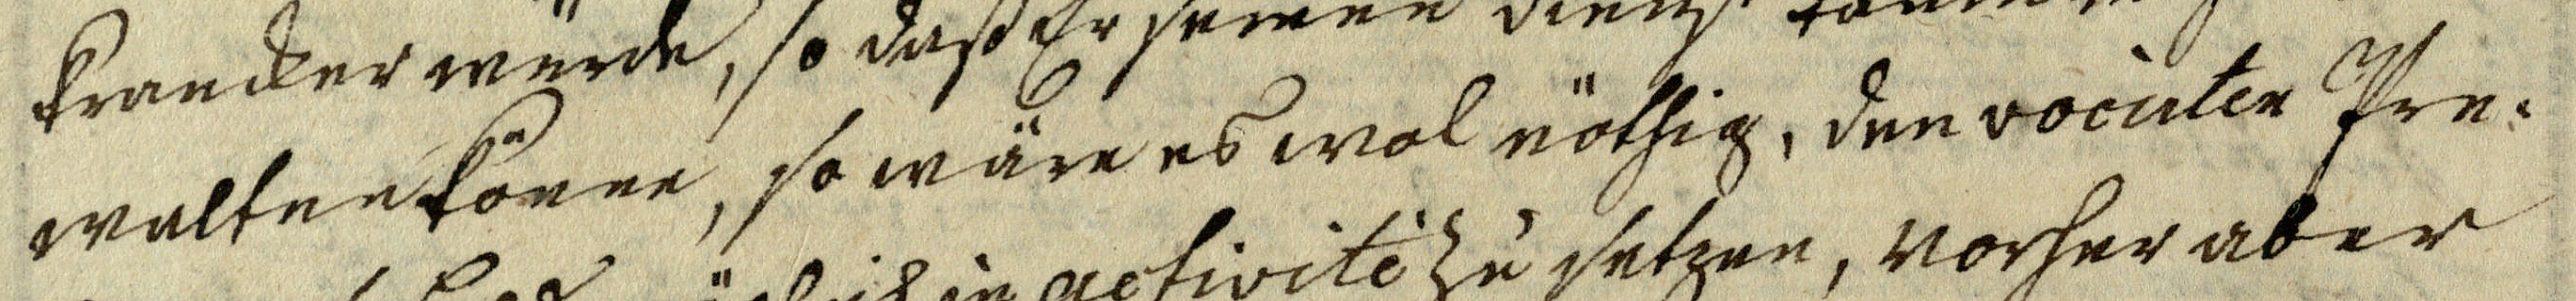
walten könne, so wäre es wol nöthig, den vocaten Pre¬
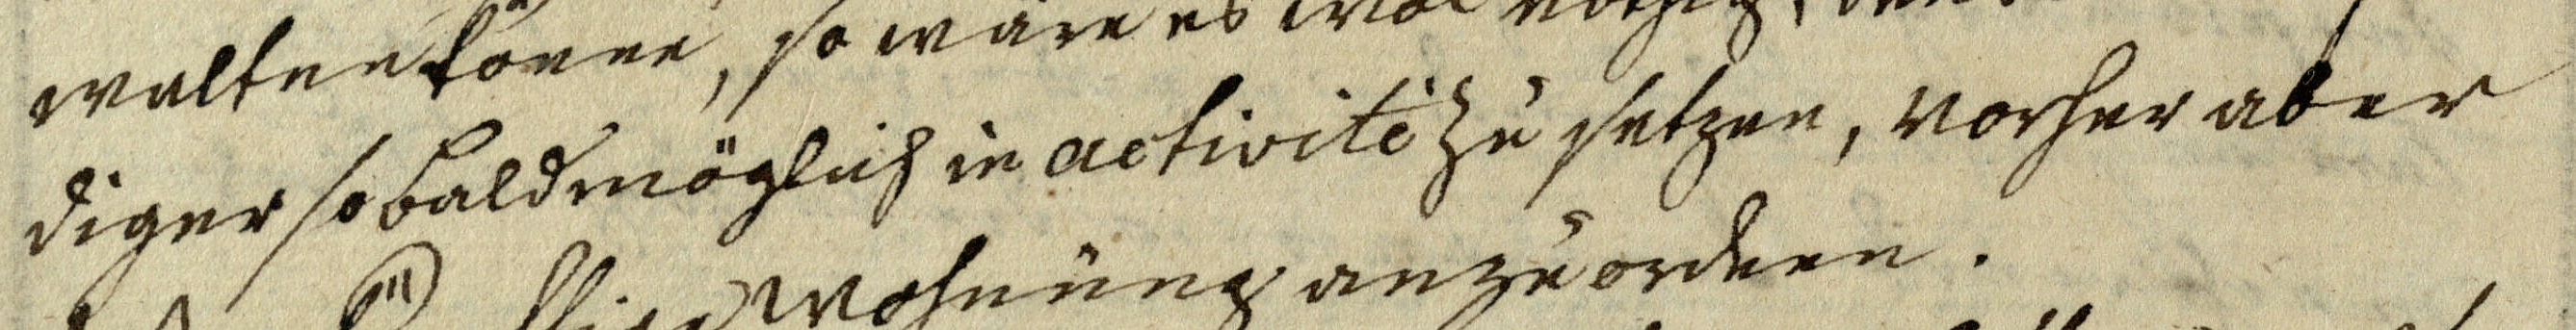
diger so bald möglich in activitè zu setzen, vorher aber
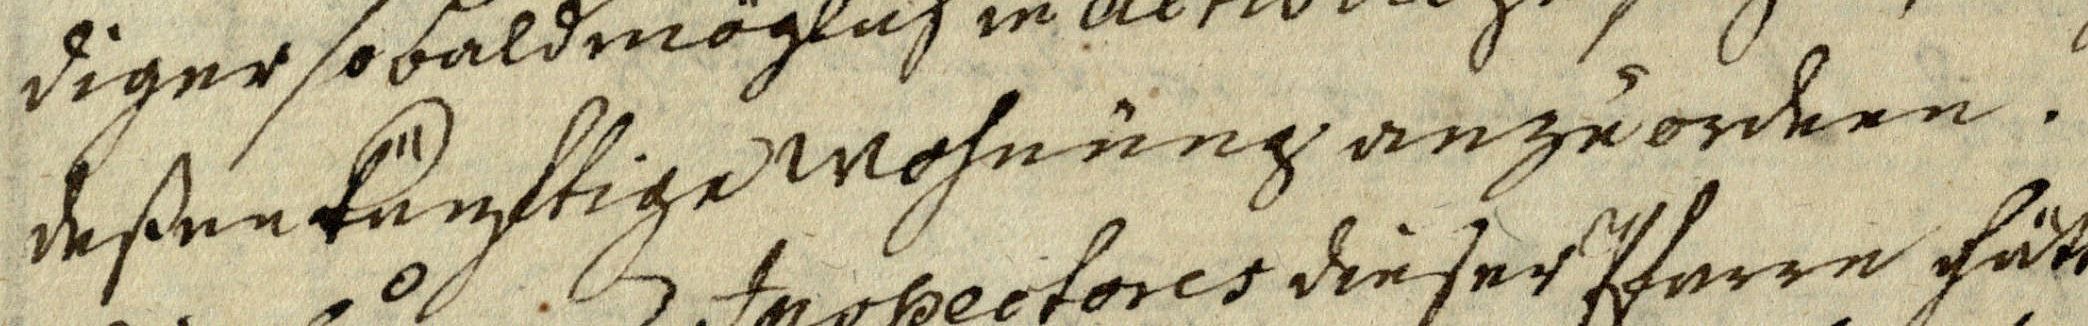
deßen künftige Wohnung anzuordnen.
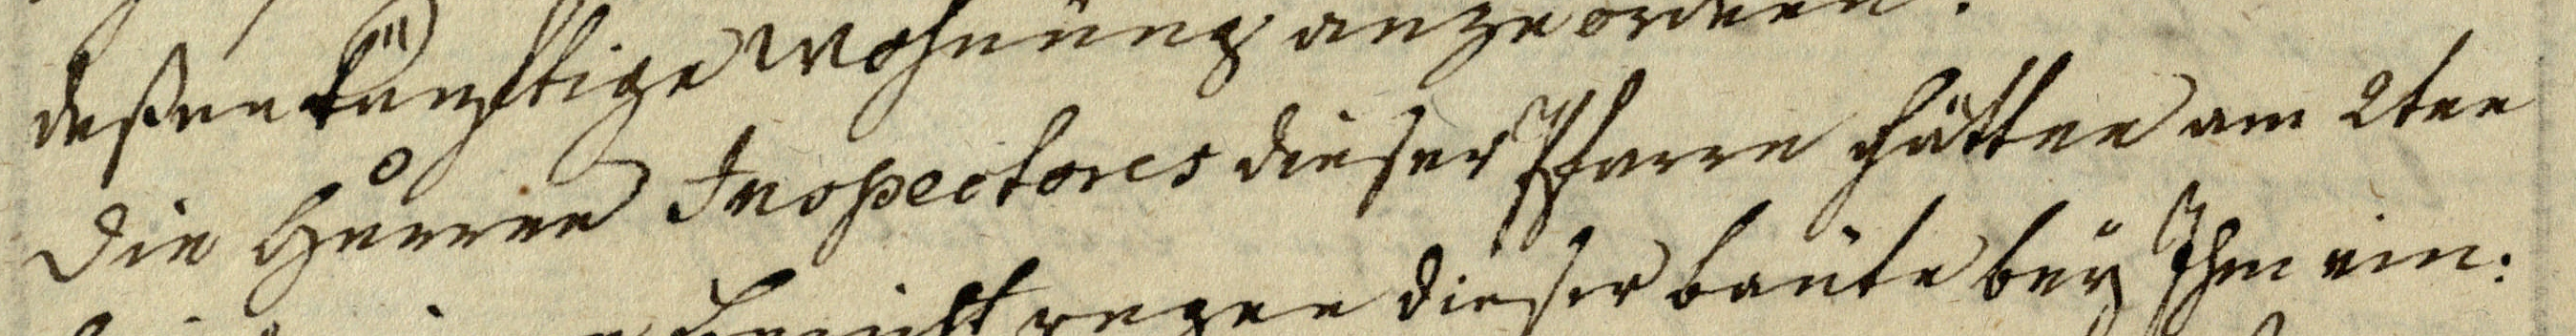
Die Herren Inspectores dieser Pfarre hätten am 2 ten
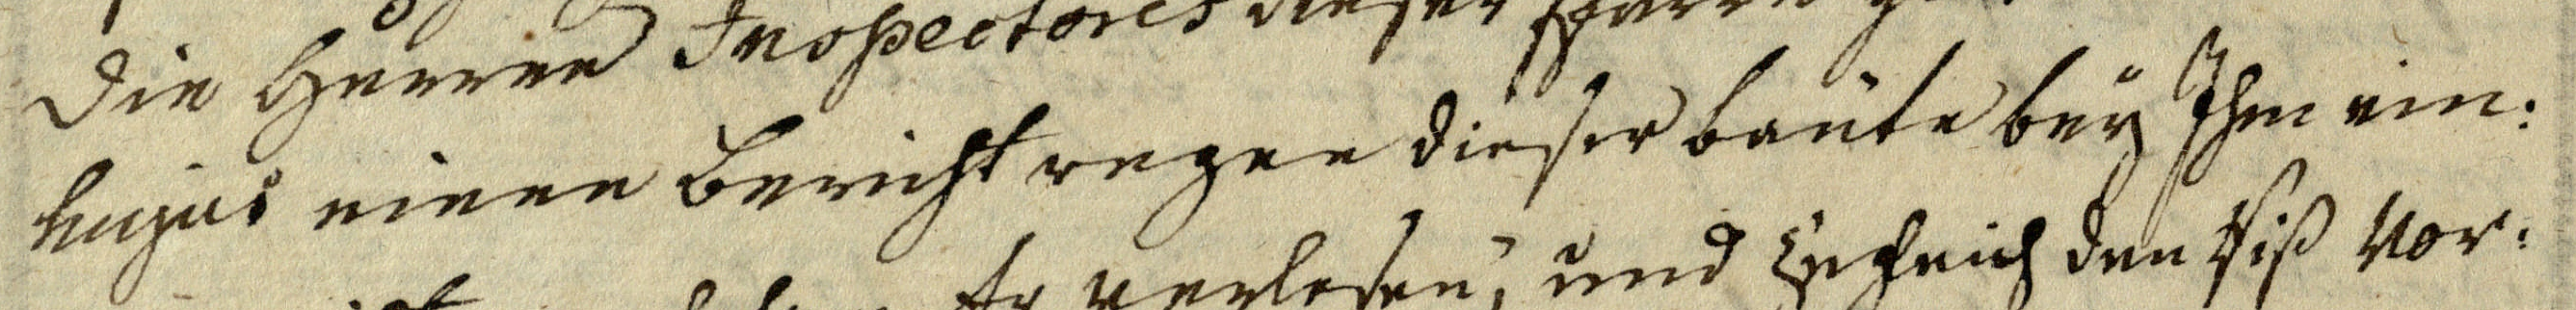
hujus einen Bericht wegen dieser Baute beÿ Ihm ein¬
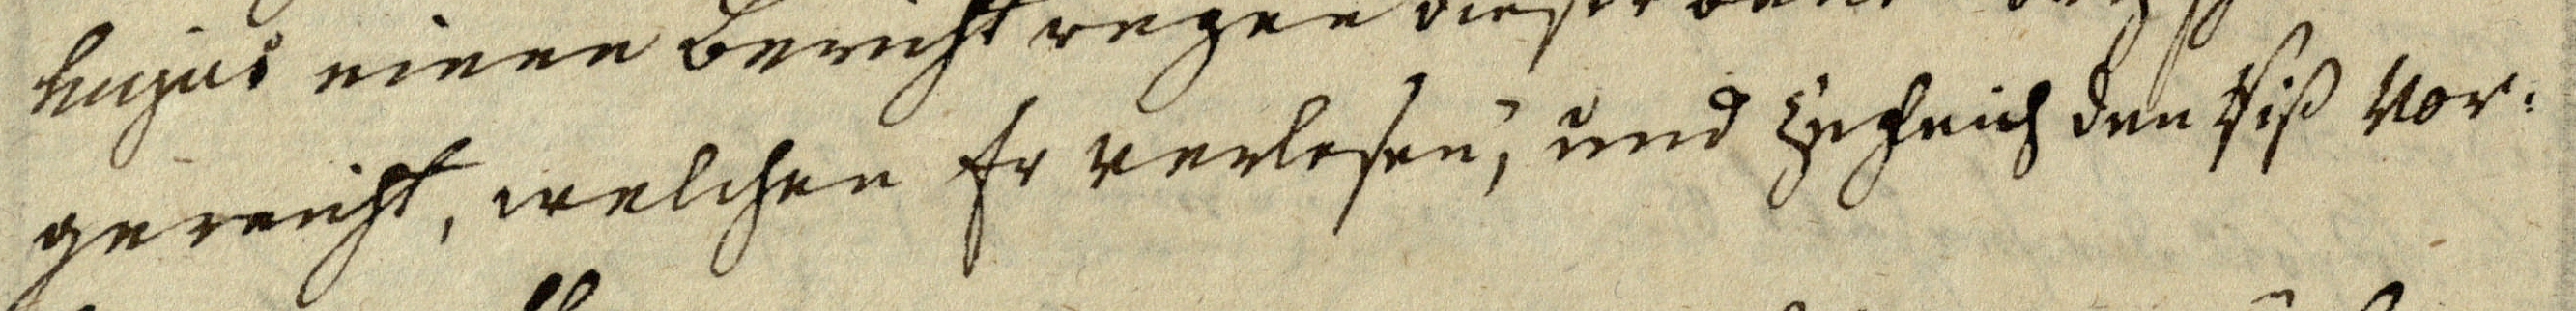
gereicht, welchen Er verlesen, und zugleich den Riß vor¬
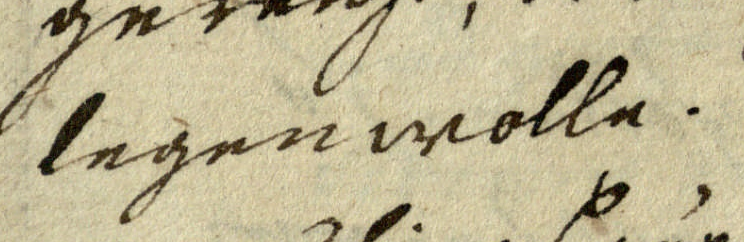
legen wolle.
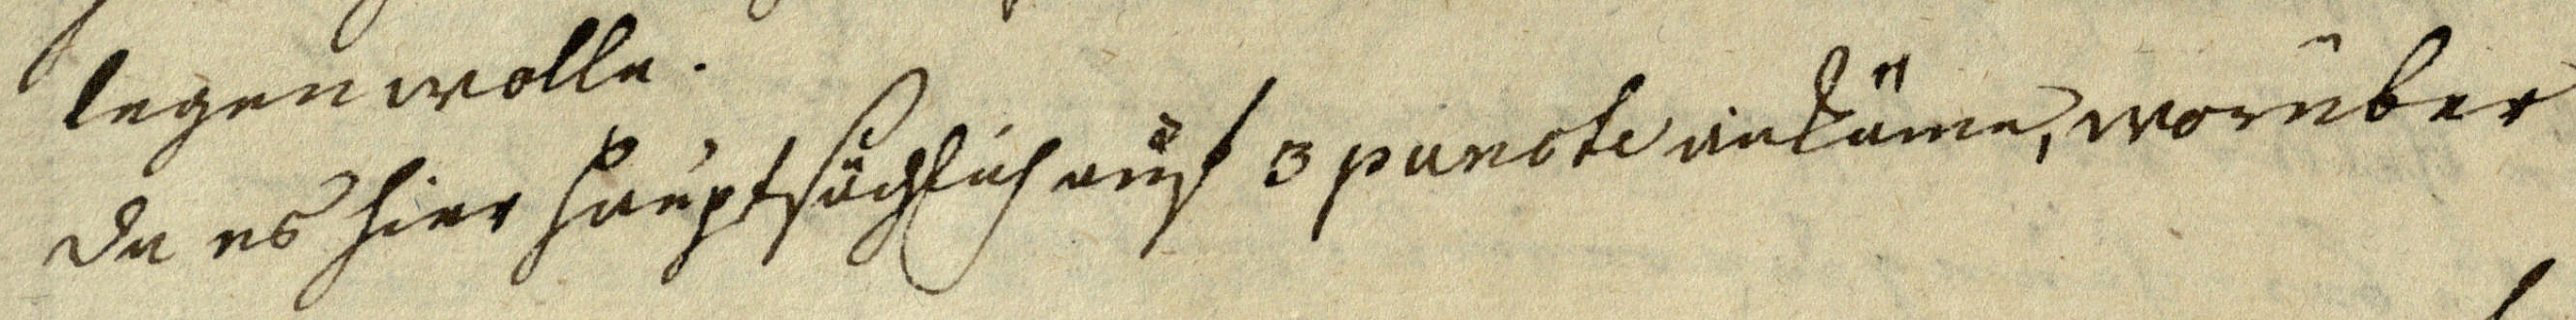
Da es hier hauptsächlich auf 3 puncte ankäme, worüber
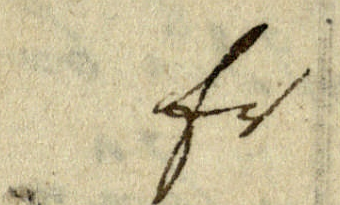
Er
